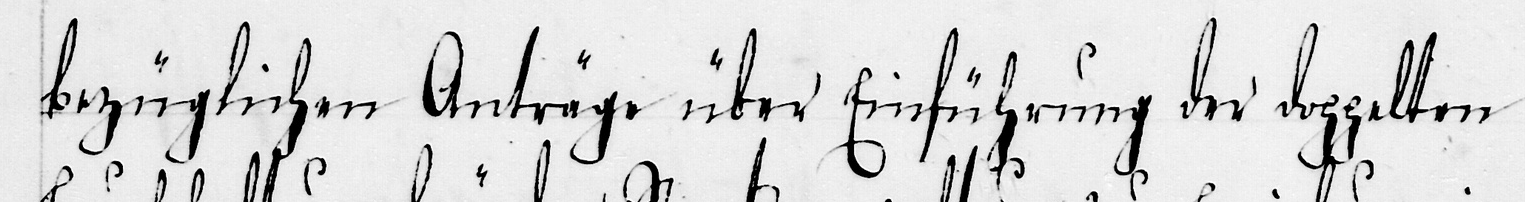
bezüglichen Anträge über Einführung der doppelten
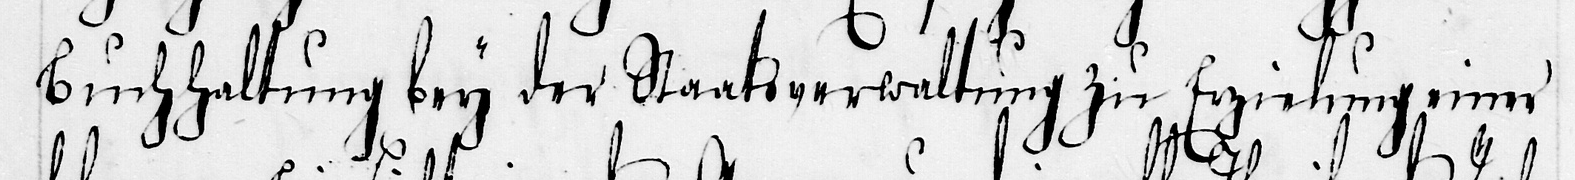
Buchhaltung bey der Staatsverwaltung zu Erzielung einer
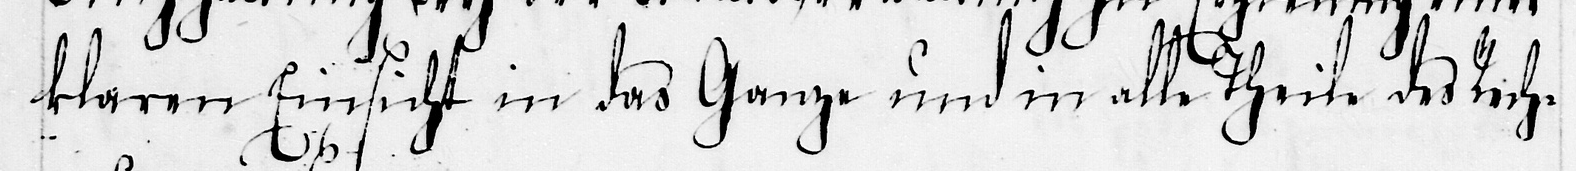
klaren Einsicht in das Ganze und in alle Theile des Rech¬
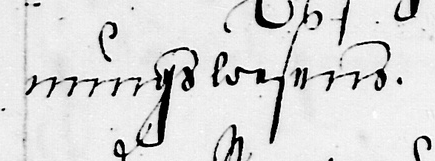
nungswesens.
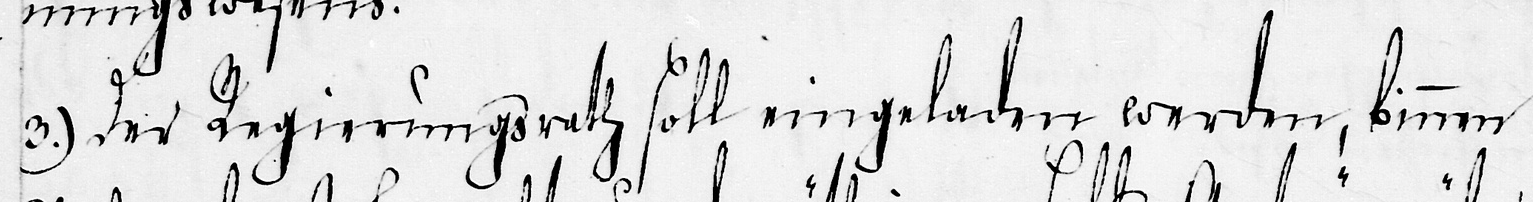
3.) Der Regierungsrath soll eingeladen werden, binnen
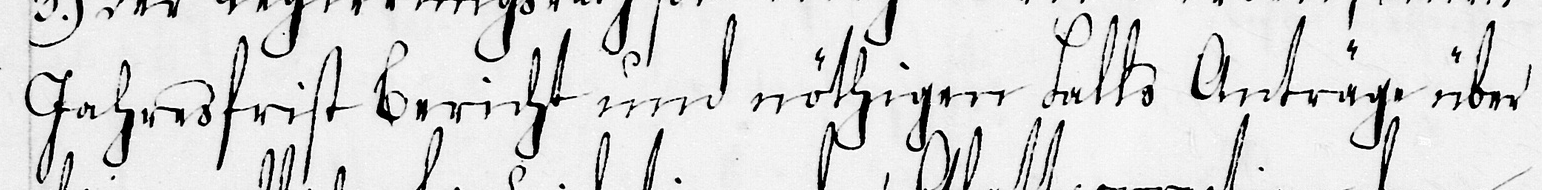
Jahresfrist Bericht und nöthigen Falls Anträge über
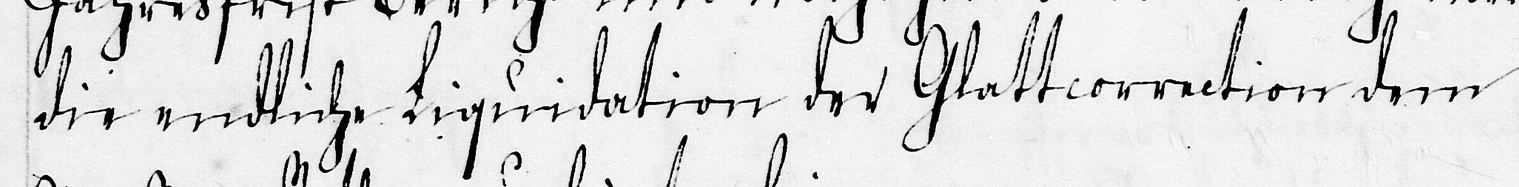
die endliche Liquidation der Glattcorrection dem
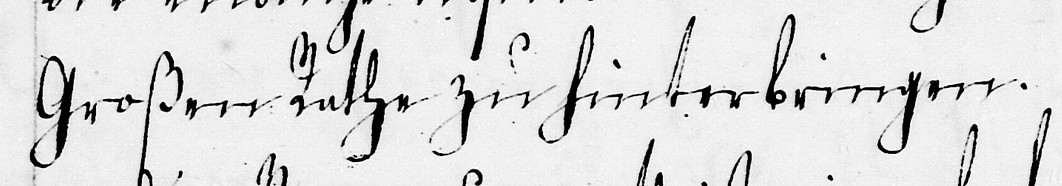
Großen Rathe zu hinterbringen.
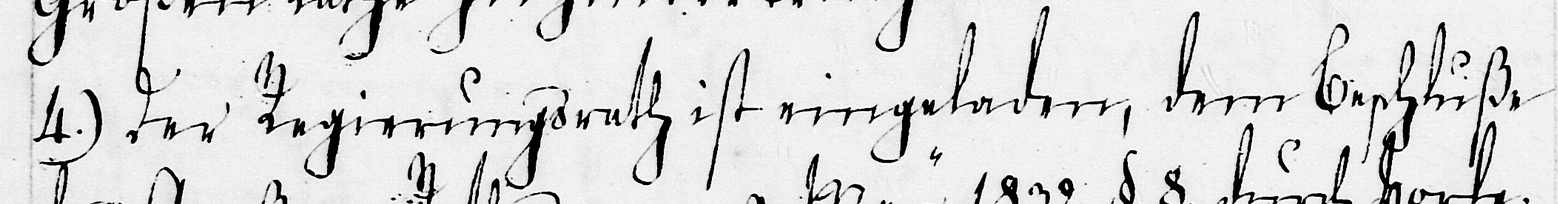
4.) Der Regierungsrath ist eingeladen, dem Beschluße
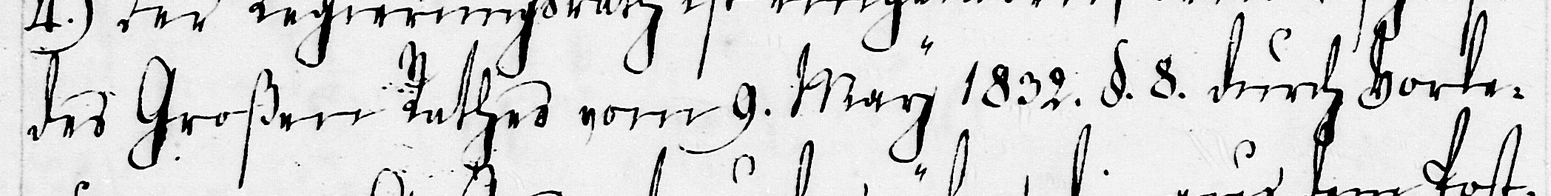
des Großen Rathes vom 9. März 1832. §. 8. durch Vorle¬
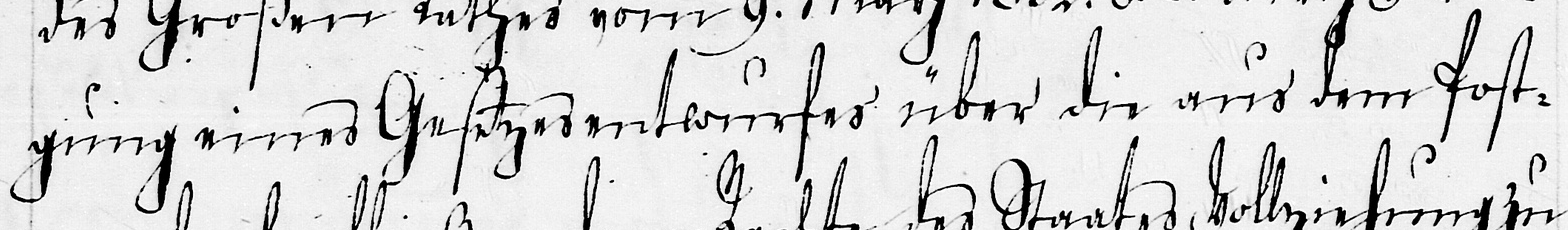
gung eines Gesetzesentwurfes über die aus dem Post¬
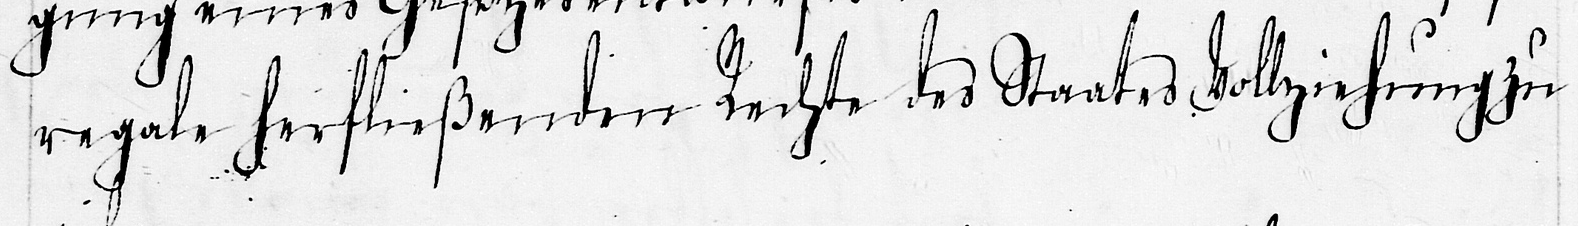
regale herfließenden Rechte des Staates Vollziehung zu
